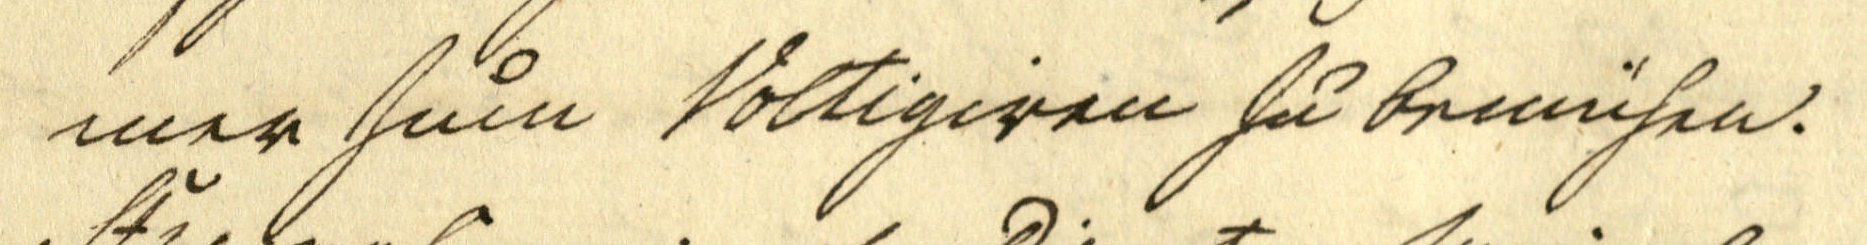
mer zum Voltigiren zu bemühen.
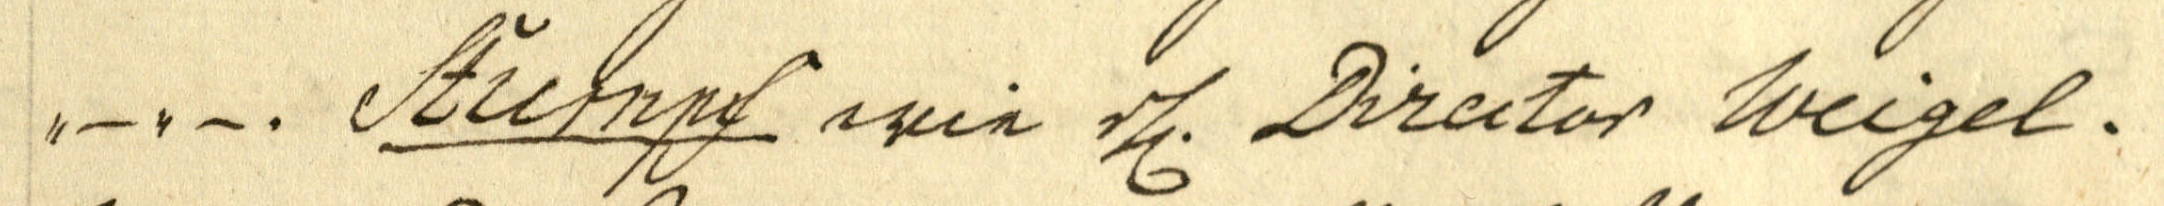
" - " - " Stumpf wie dh. Director Weigel.
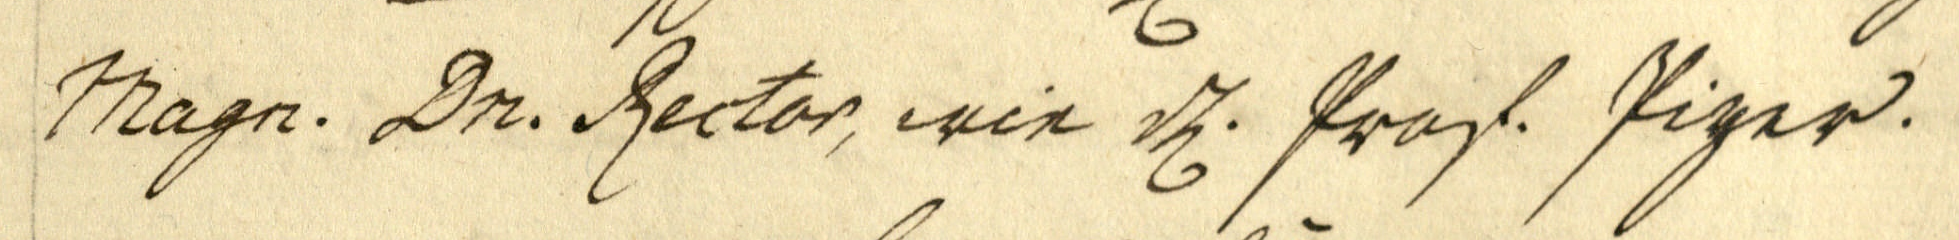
Magn. Dn. Rector, wie dh. Prof. Piper.
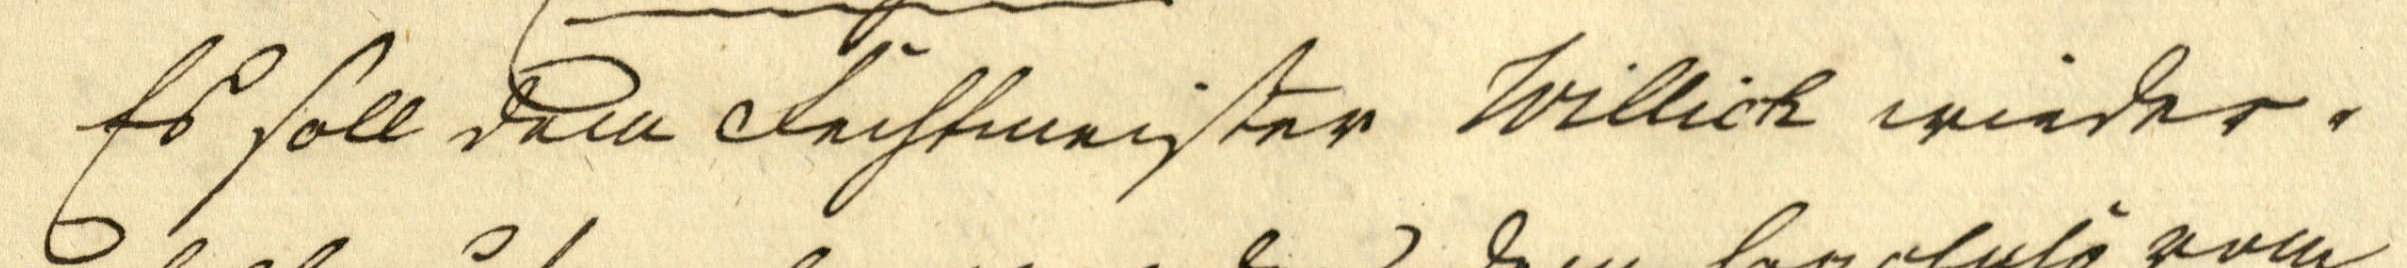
Es soll dem Fechtmeister Willich wieder-
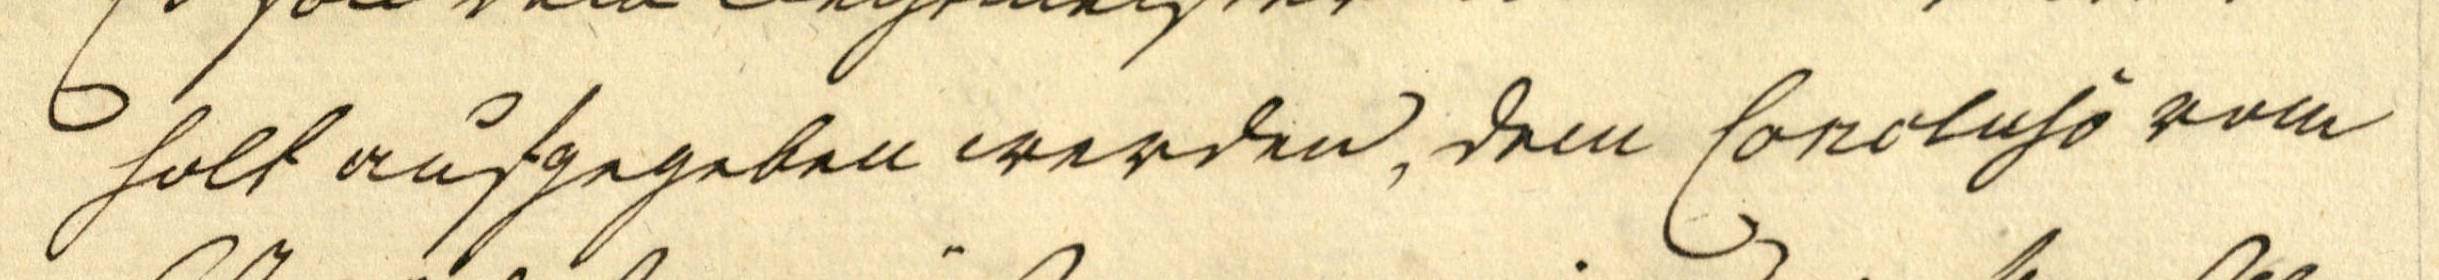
holt aufgegeben werden, dem Concluso vom
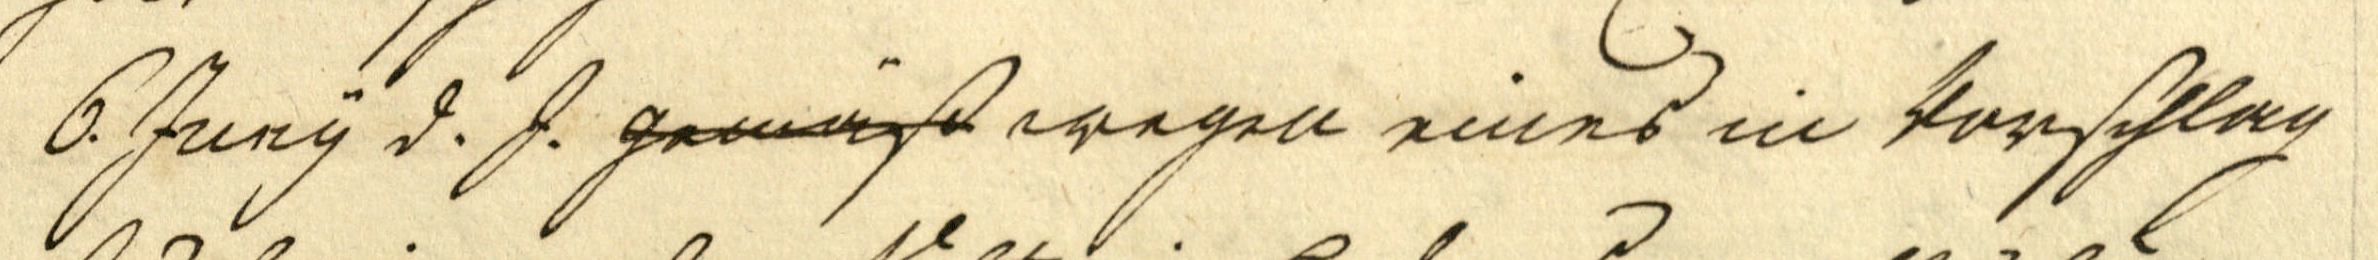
6. Juny d. J. gemäß wegen eines in Vorschlag
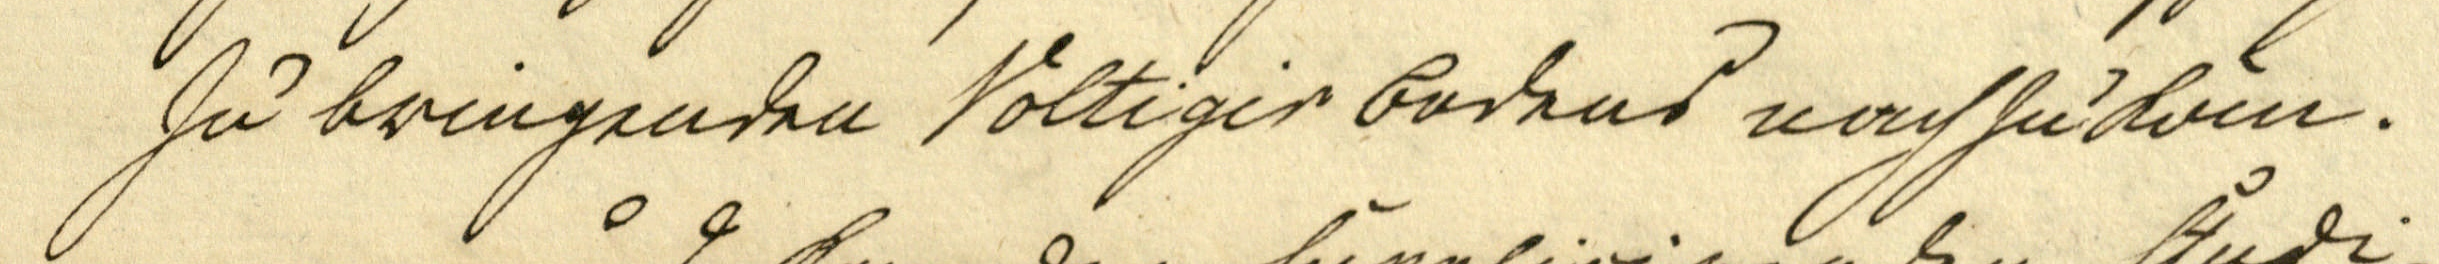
zu bringenden Voltigirbodens nachzukom-
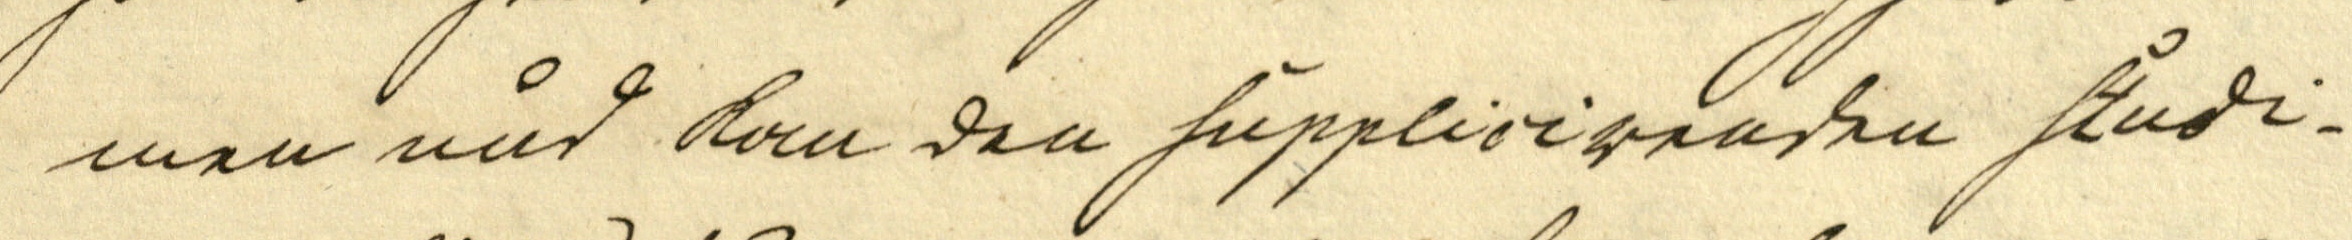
men und kan den supplicirenden studi-
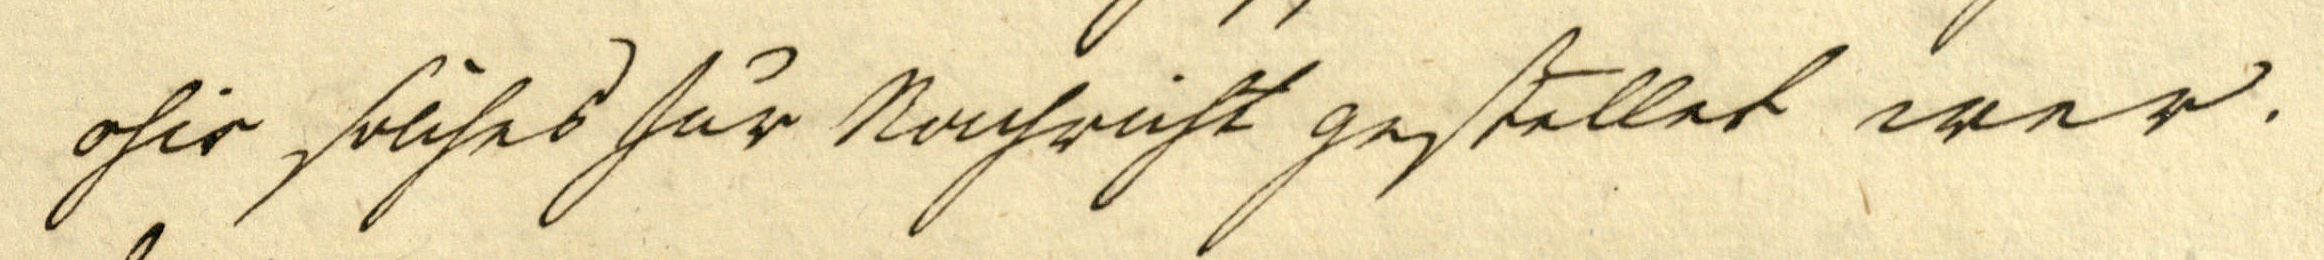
osis solches zur Nachricht gestellet wer-
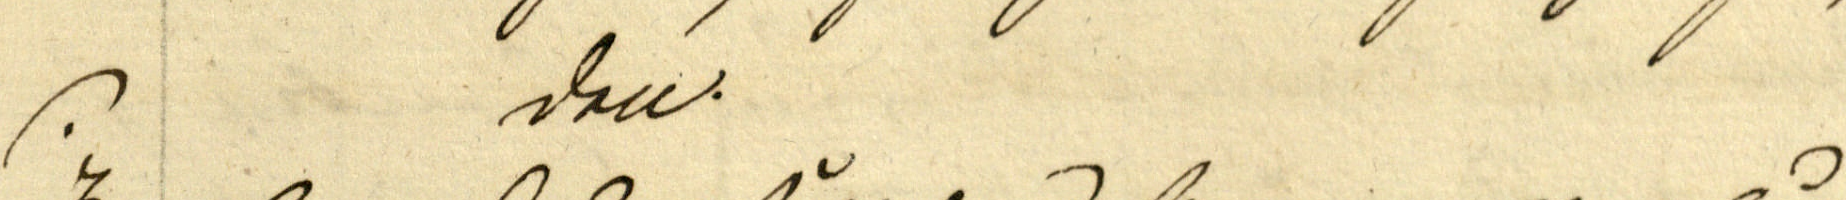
den
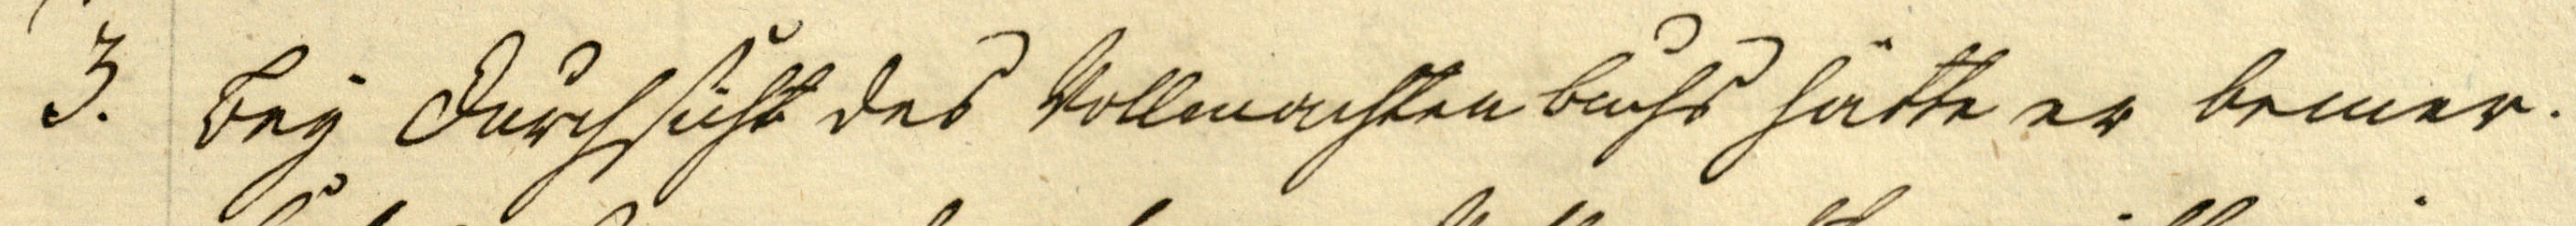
3. Bey Durchsicht des Vollmachtenbuchs hätte er bemer-
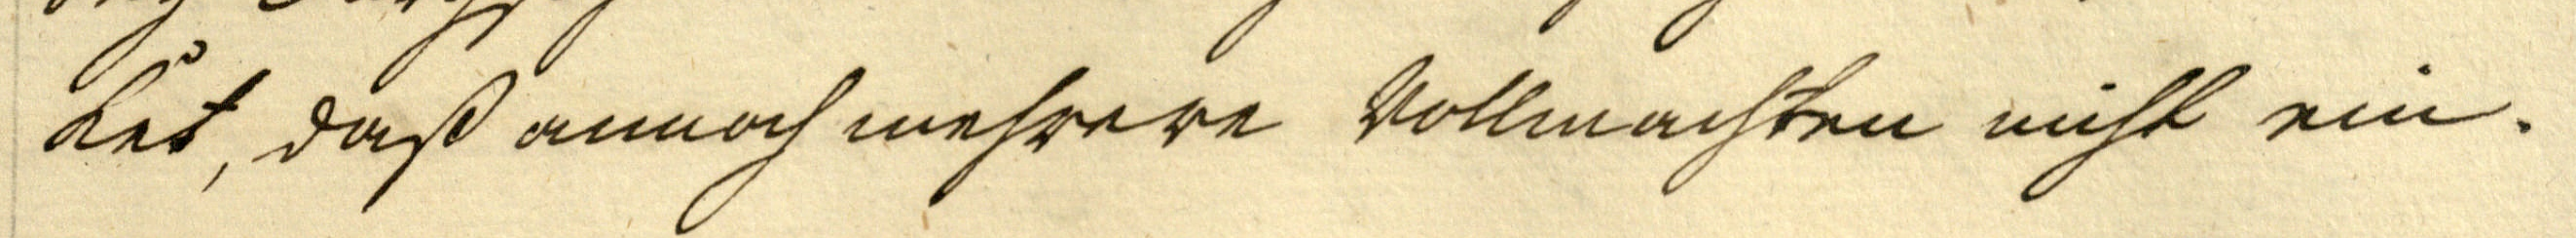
ket, daß annoch mehrere Vollmachten nicht ein-
